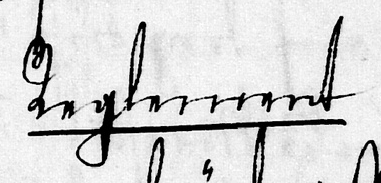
Reglement
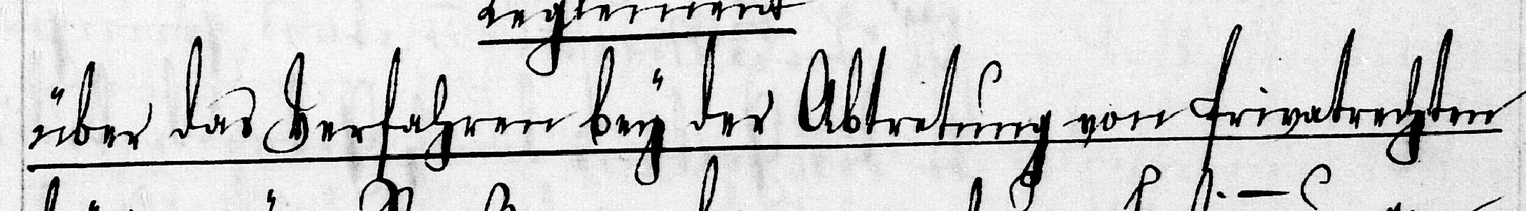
über das Verfahren bey der Abtretung von Privatrechten
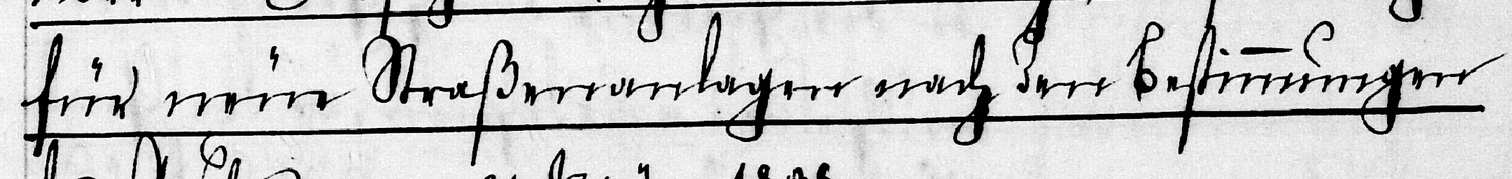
für neue Straßenanlagen nach den Bestimmungen
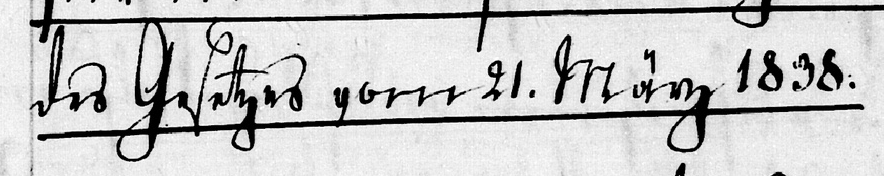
des Gesetzes vom 21. März 1838.
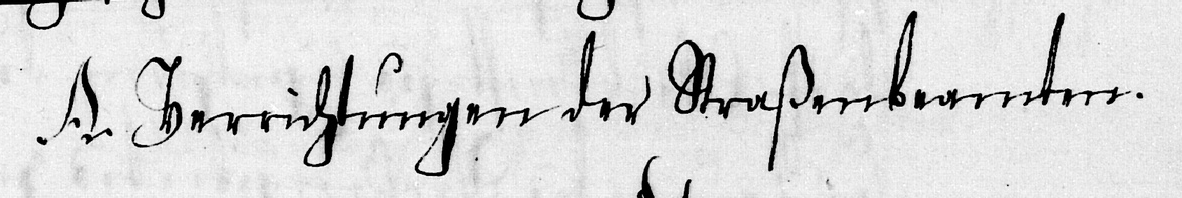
A. Verrichtungen der Straßenbeamten.
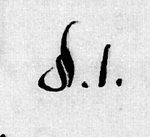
§. 1.
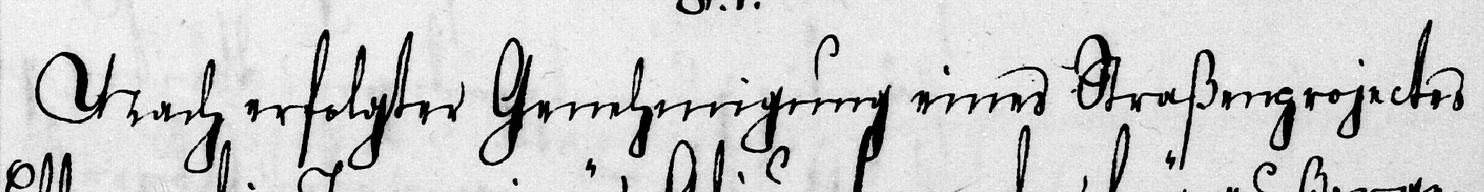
Nach erfolgter Genehmigung eines Straßenprojectes
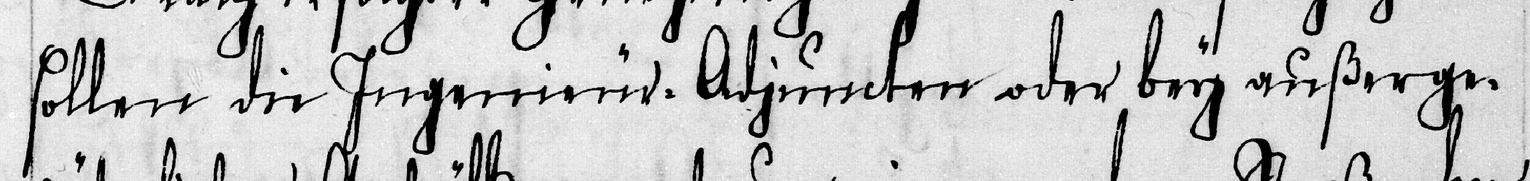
sollen die Ingenieur-Adjuncten der bey außerge¬
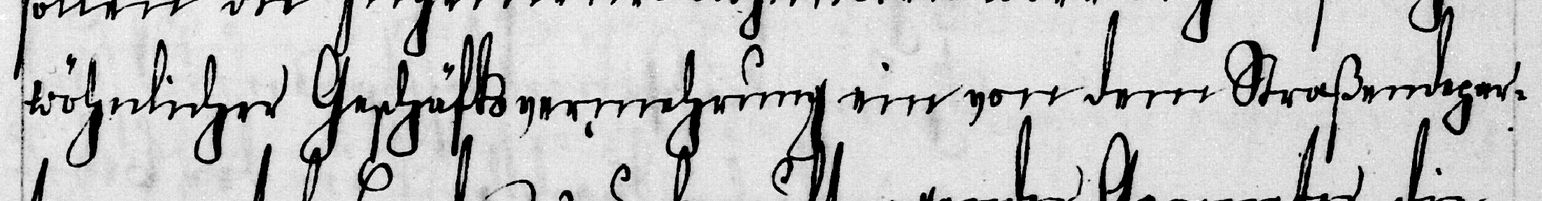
wöhnlicher Geschäftsvermehrung ein von dem Straßendepar¬
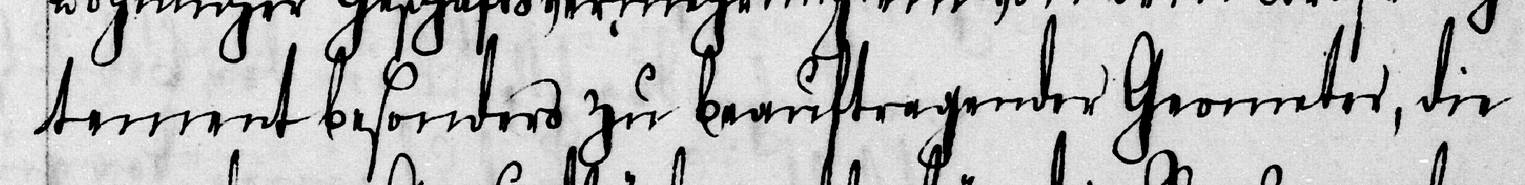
tement besonders zu beauftragender Geometer, die
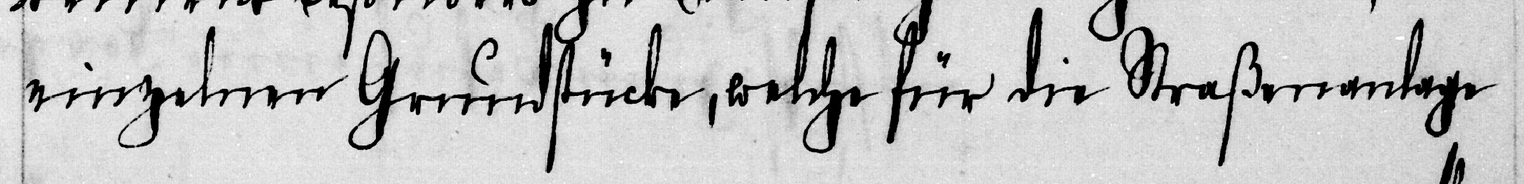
einzelnen Grundstücke, welche für die Straßenanlage
